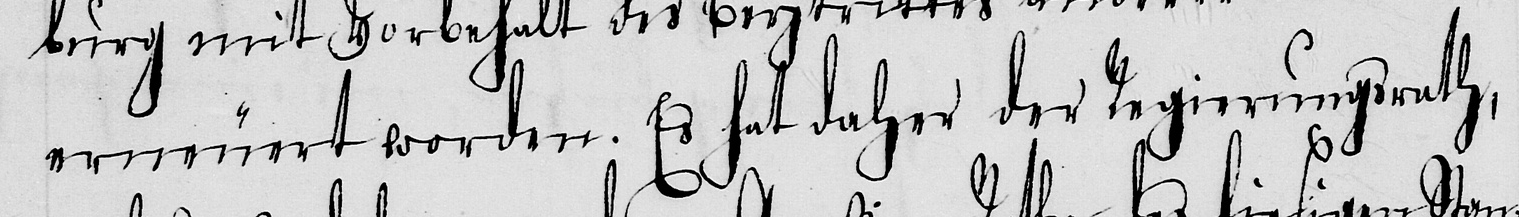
erneuert worden. Es hat daher der Regierungsrath,
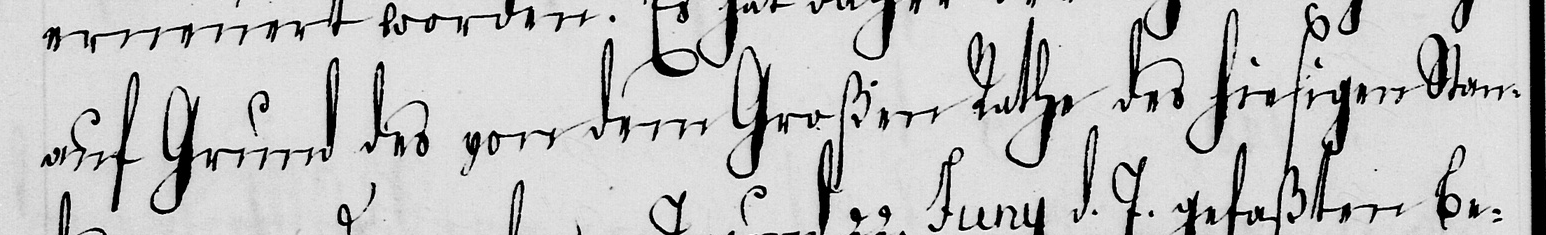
auf Grund des von dem Großen Rathe des hiesigen Stan¬
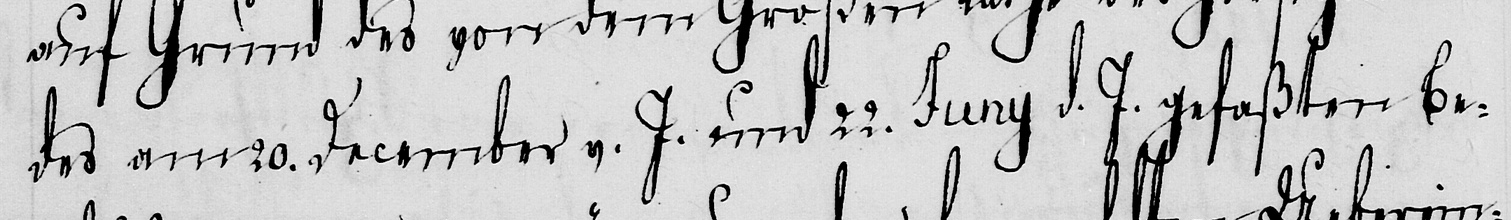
des am 20. December v. J. und 22. Juny d. J. gefaßten Be¬
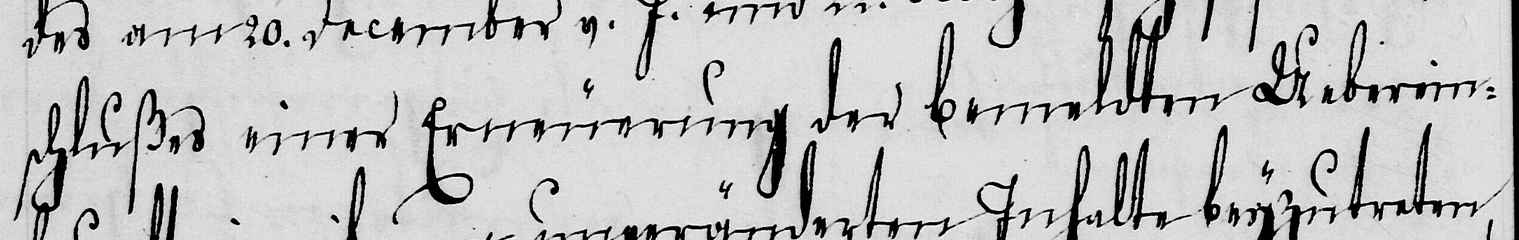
schlußes einer Erneuerung der bemeldten Ueberein¬
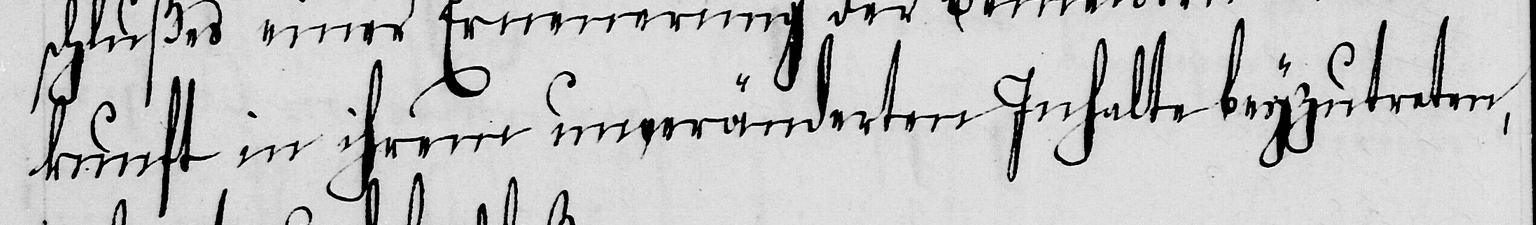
kunft in ihrem unveränderten Inhalte beyzutreten,
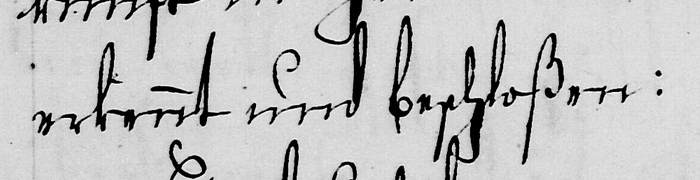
erkennt und beschloßen:
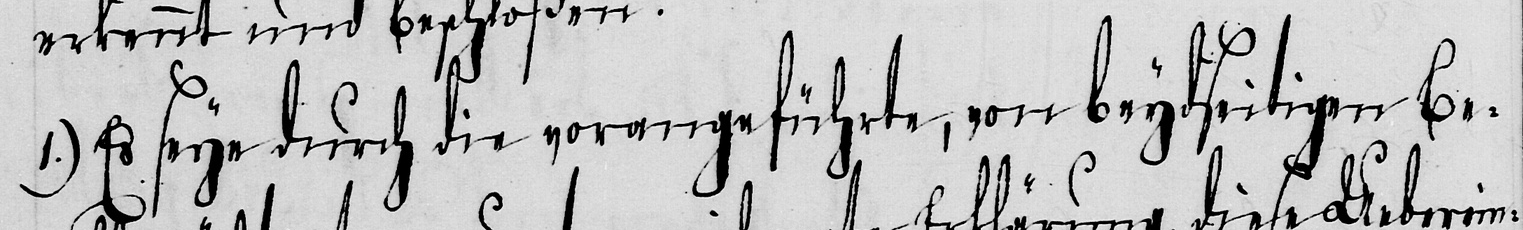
Es seye durch die vorangeführte, von beydseitigen Be¬
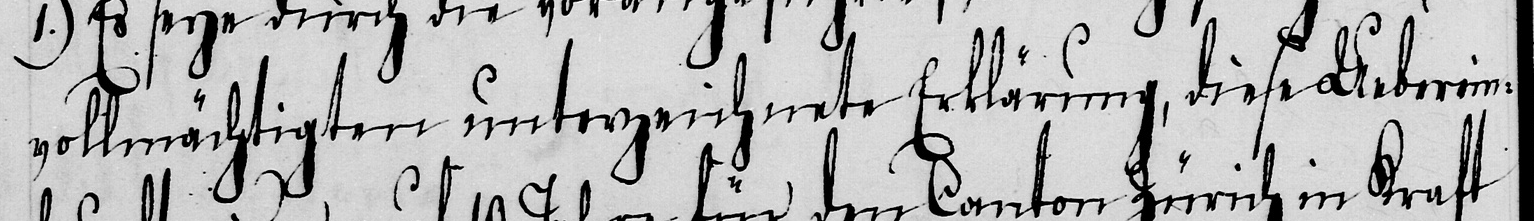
vollmächtigten unterzeichnete Erklärung, diese Ueberein¬
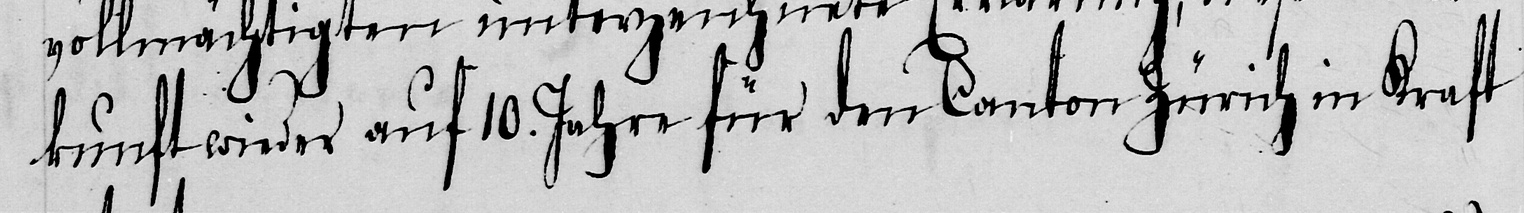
kunft wieder auf 10. Jahre für den Canton Zürich in Kraft
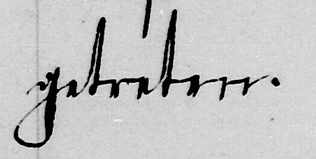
getreten.
